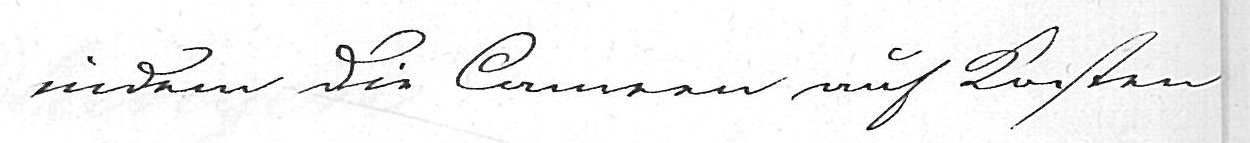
indem die Cameen auf Kosten
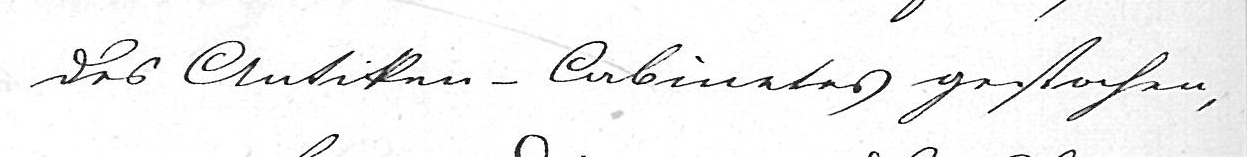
des Antiken-Cabinetes gestochen,
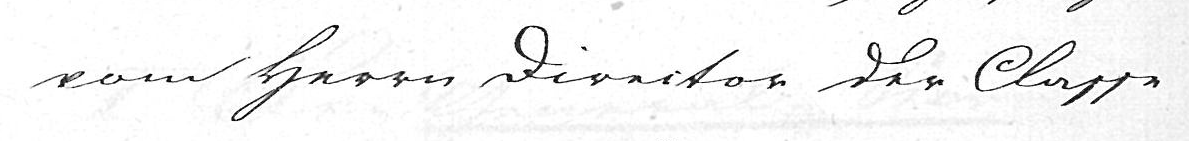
vom Herrn Director der Classe
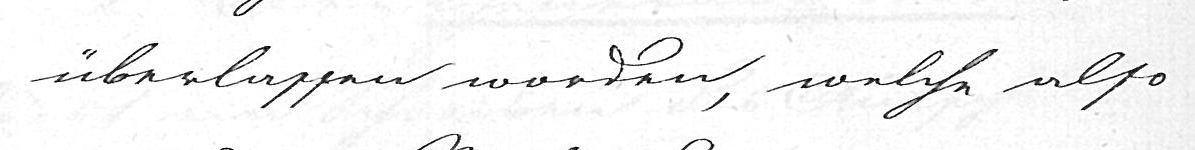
überlassen worden, welche also
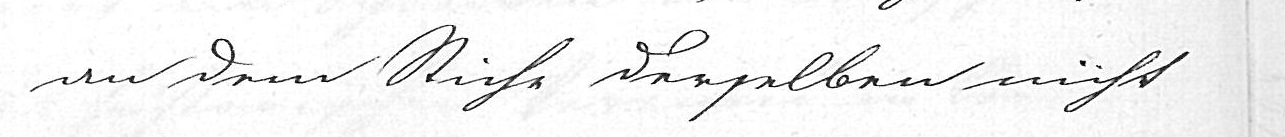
an dem Stiche derselben nicht
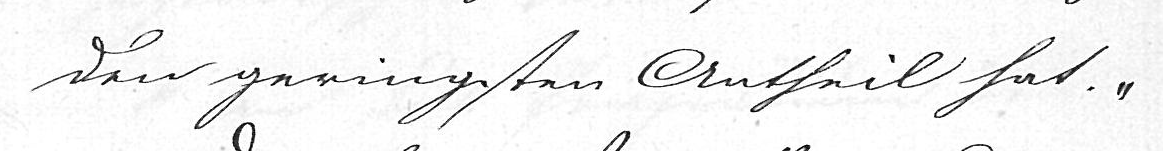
den geringsten Antheil hat."
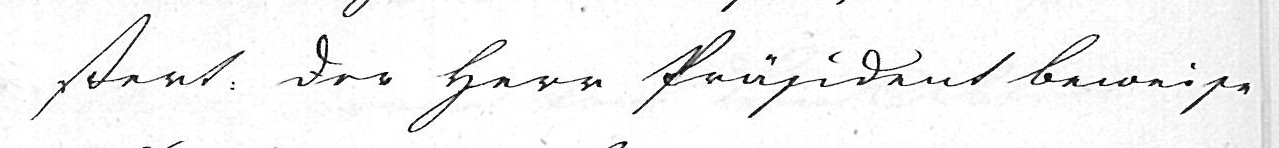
ßert, der Herr Präsident beweise
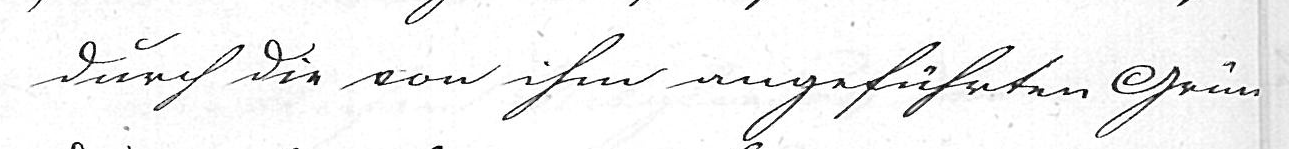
durch die von ihm angeführten Grün-
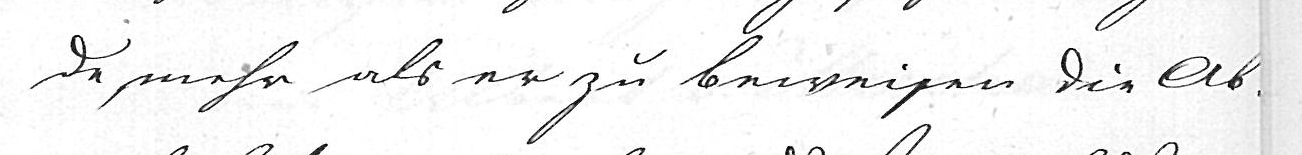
de mehr als er zu beweisen die Ab-
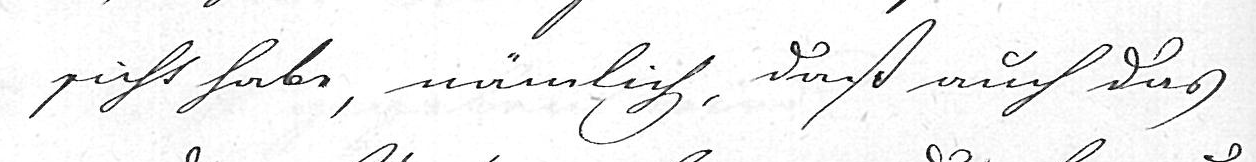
sicht habe, nämlich, daß auch das
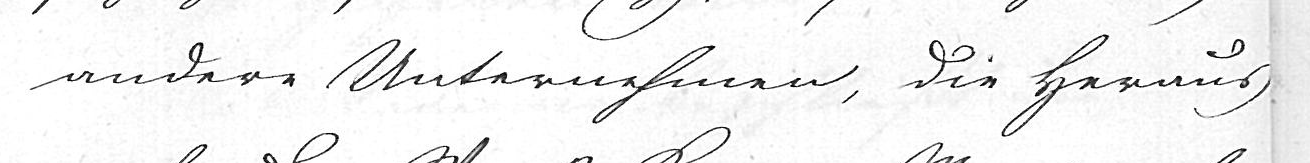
andere Unternehmen, die Heraus-
